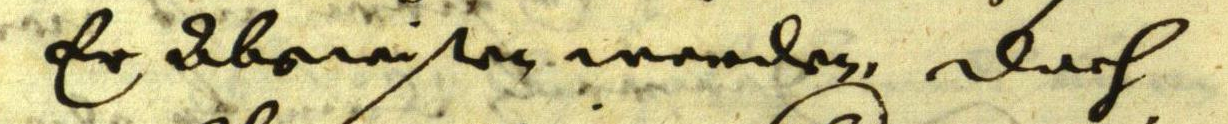Er Abgwisen werden, doch
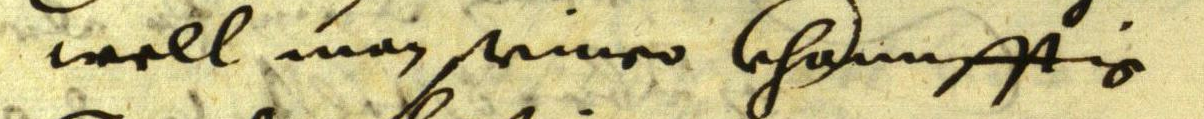well man seinen khonnfftig
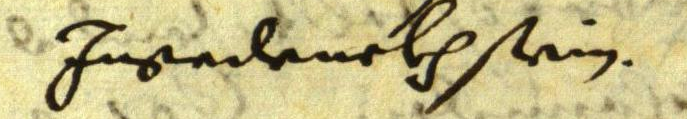Ingedenckh sein.
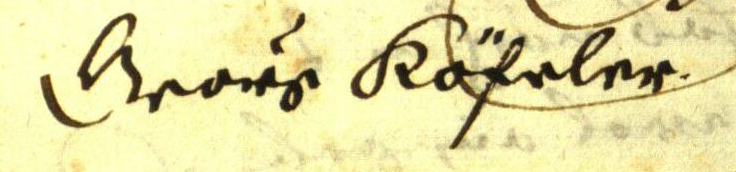Geōrg Köfeler
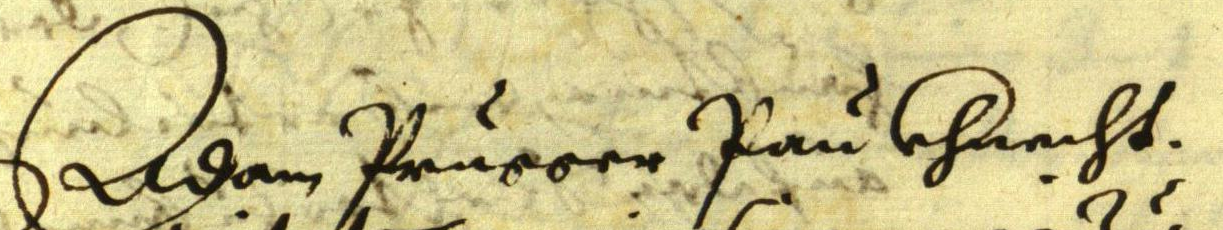Adam Prūgger Paūkhnecht.
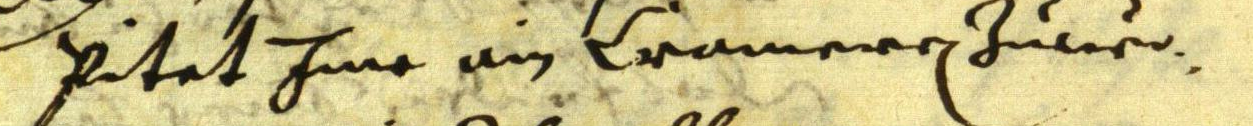Pitet Ime ain Cramerei Zūvēr¬
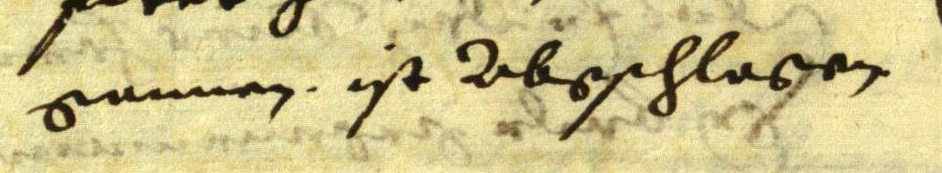gonnen. ist Abgschlagen.
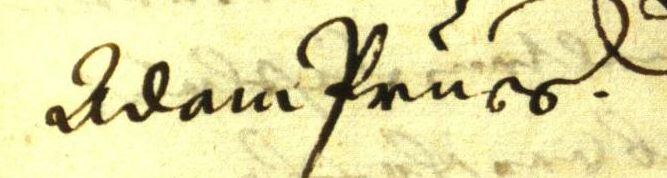Adam Prūgg.
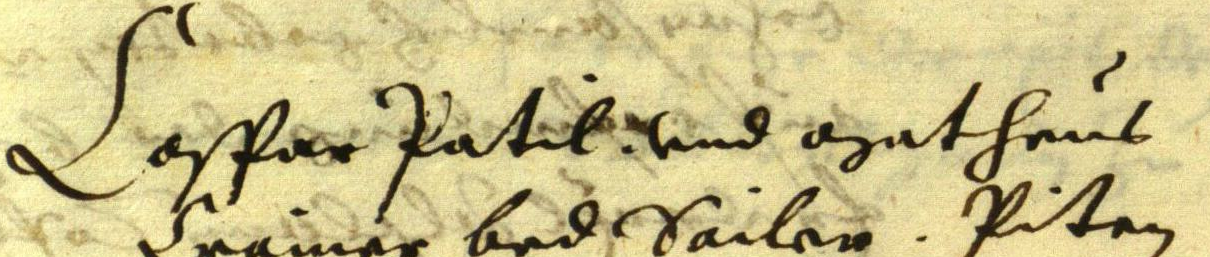CasPar Patil. vnd Matheūs
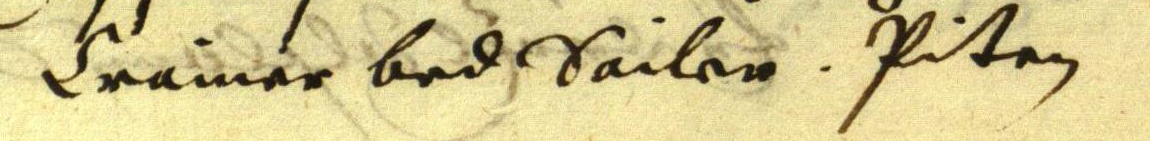Crainer bed Sailer. Piten
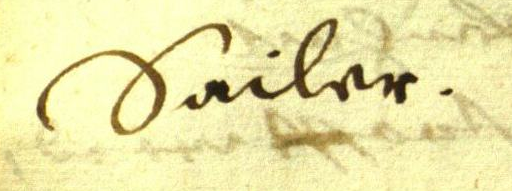Sailer.
